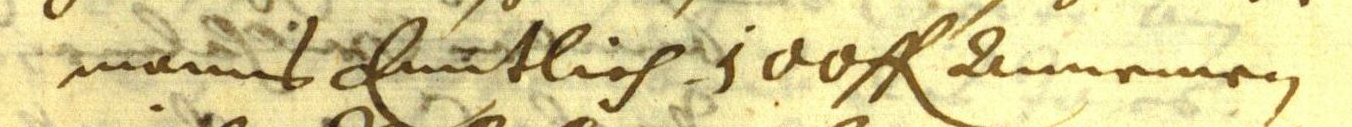manns Enntlich 100 fl Annemen
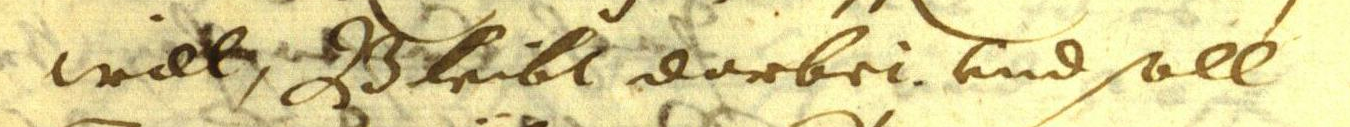will, Bleibt darbei. vnd soll
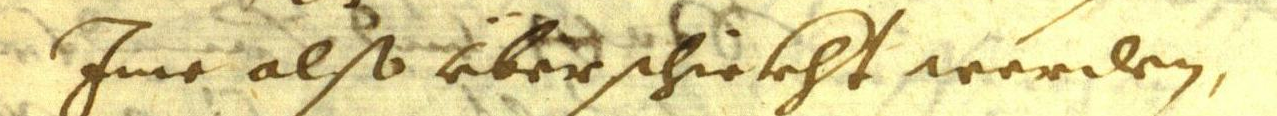Ime also v̈ber schickht werden,
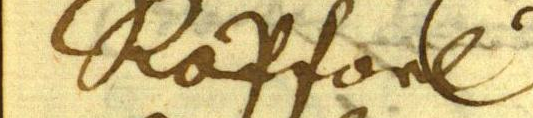RaPfael
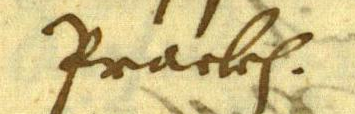Prackh.
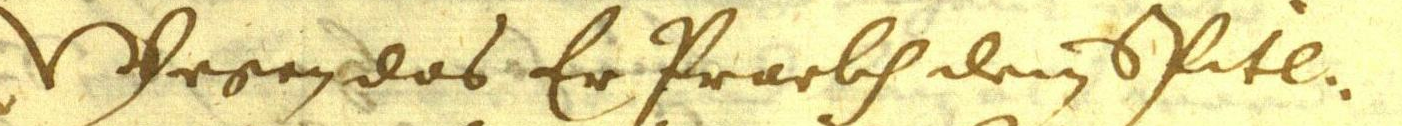Wegen das Er Prackh dem SPitl¬
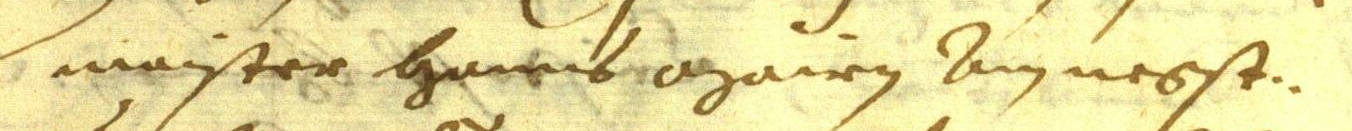maister Hanns Mairn Am negst¬
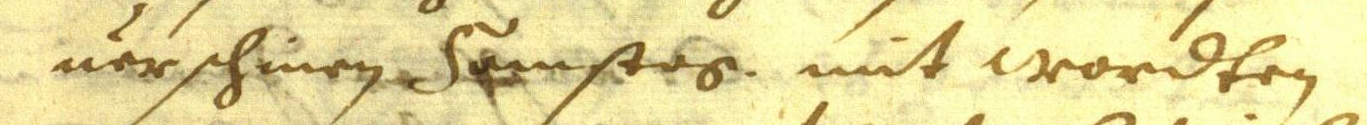ūerschinen Samstag. mit wordten
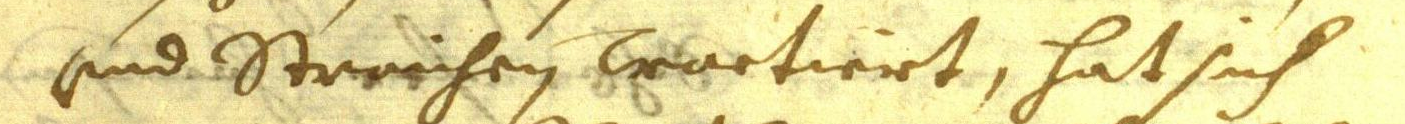vnd Straichen Tractiert, hat sich
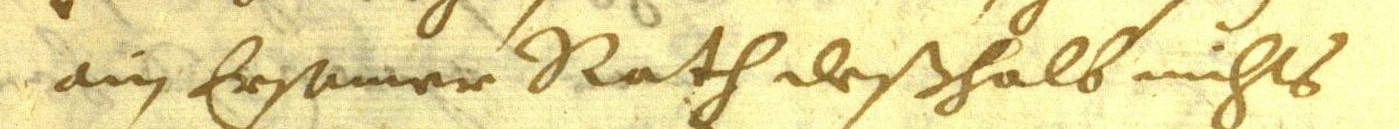ain Ersamer Rath deßhalb nichts
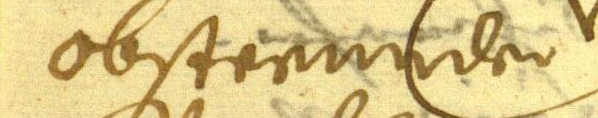Obsteender
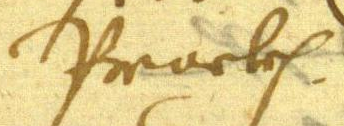Prackh.
